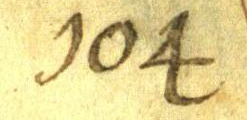104
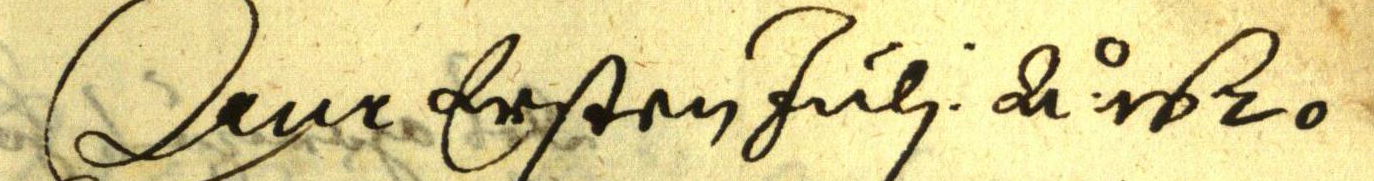Am Ersten Jūlj Ao. 1620
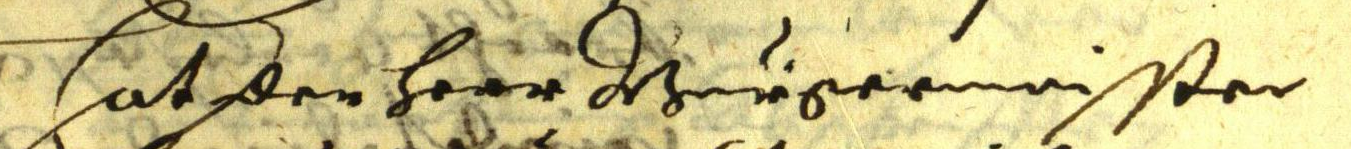Hat der herr Būrgermaisster
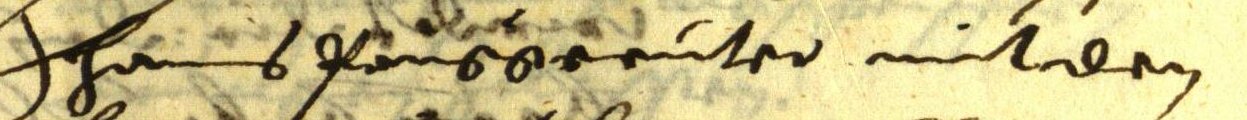Hanns Prūggreūter mit den
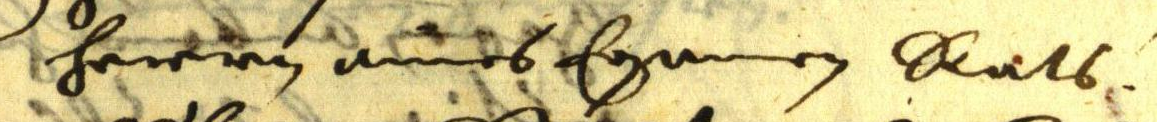herrn aines Ersamen Rats.
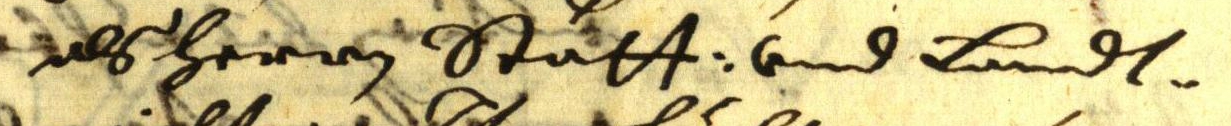als Herrn Statt: vnd Landt¬
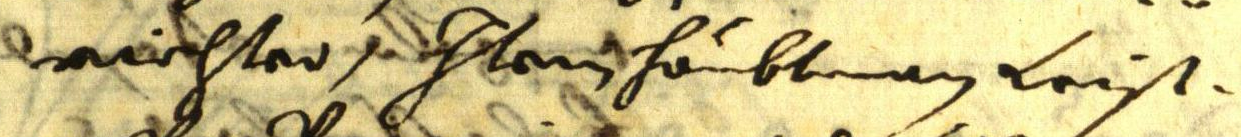richter, Item haūbtman Crist¬
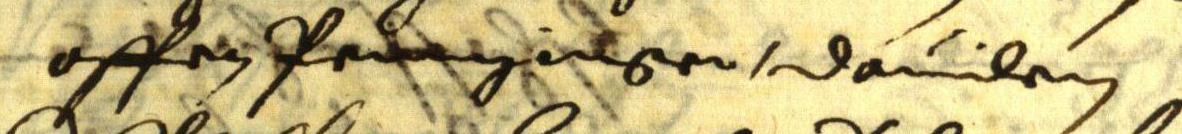offen Penntzinger, Daūiden
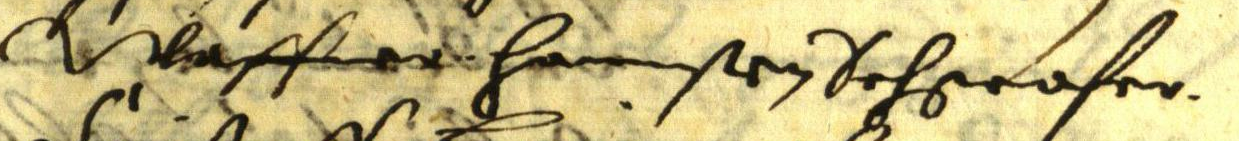Waffner. hannsen Schgrafer.
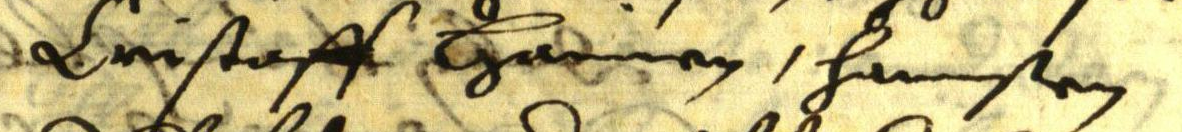Cristoff Haimen, hannsen
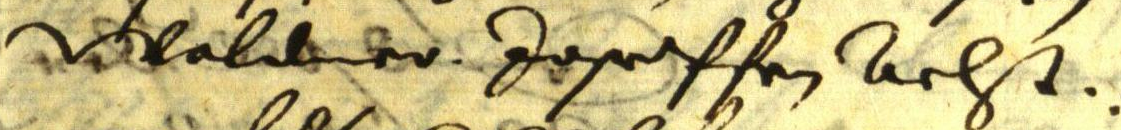Waldner. Joseffen Acht¬
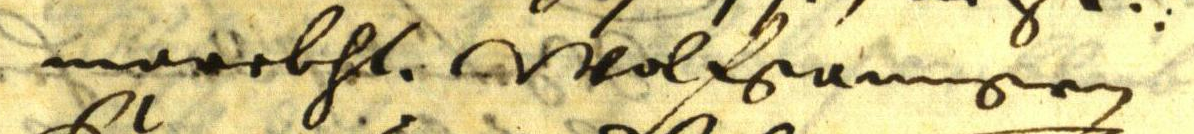marckht. Wolfganngen
